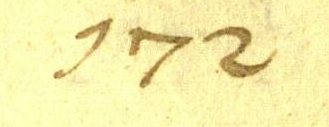172
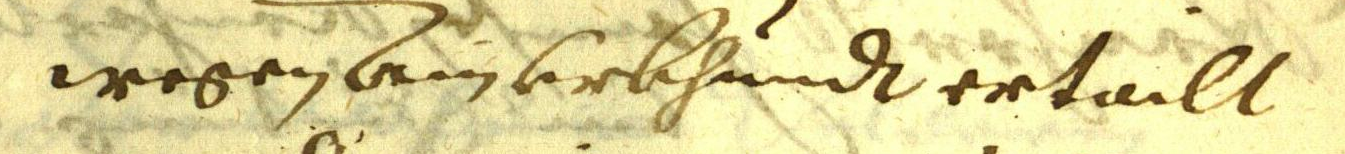wegen Ain vrkhūndt ertailt
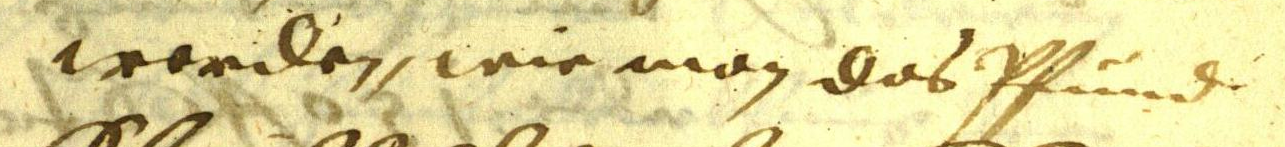werden, wie man das Pfūndt
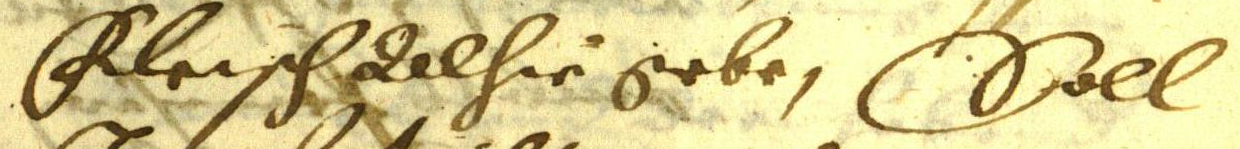Fleisch Alhie gebe, Soll
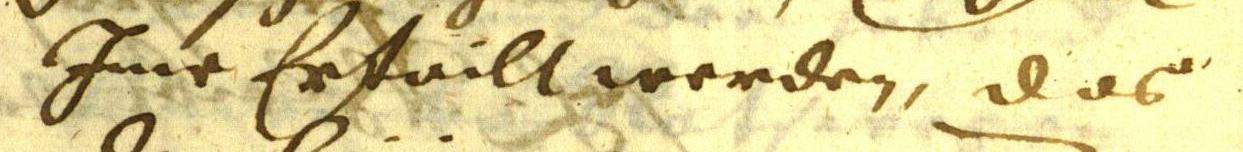Ime Ertailt werden, das
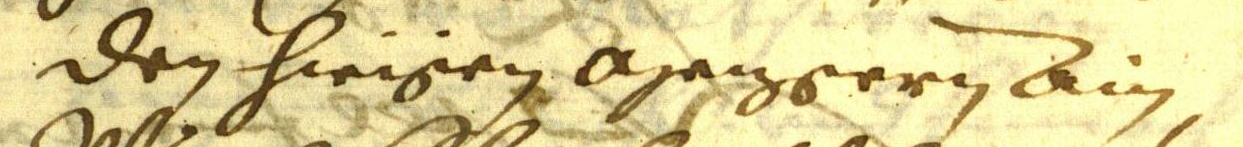den hieigen Mezgern Ain
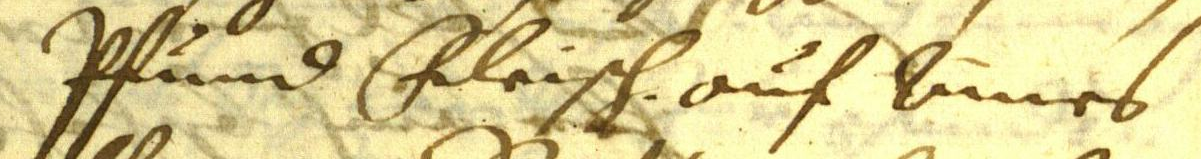Pfūnd Fleisch. aūf Aines
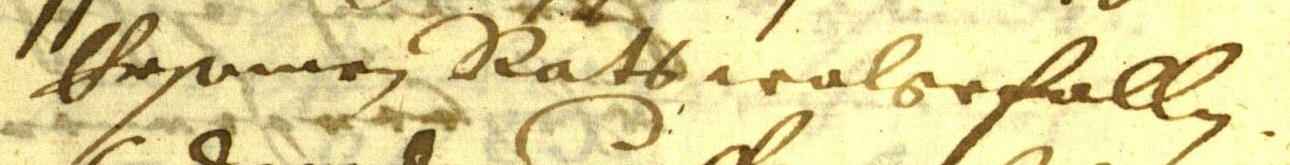Ersamen Rats wolgefalln.
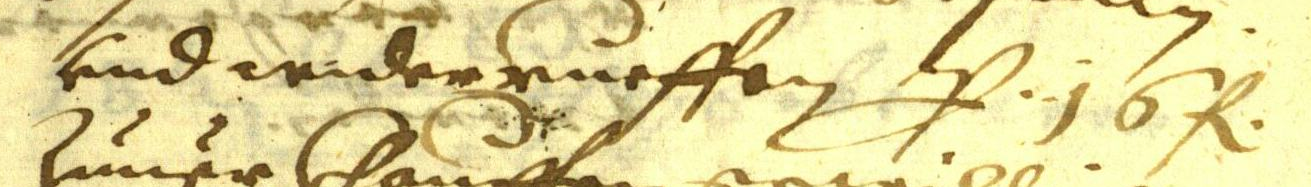vnd widerrūeffen P: 16 f.
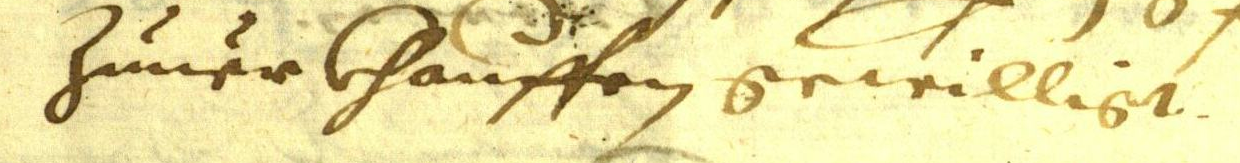Zūūerkhaūffen gewilligt.
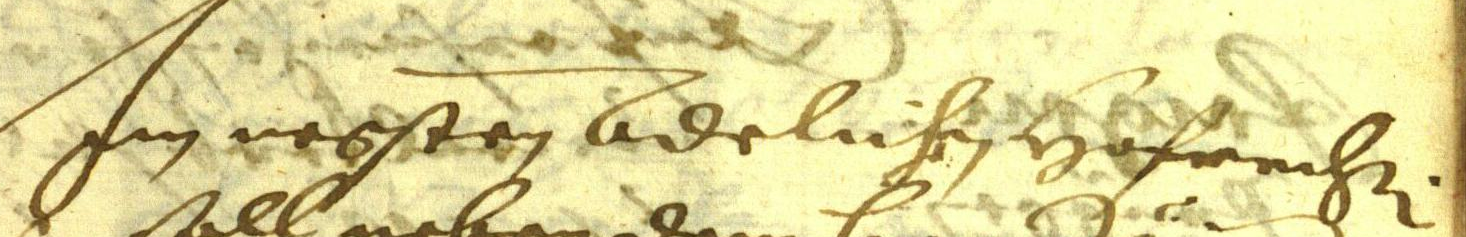Im negsten Adelichen Hofrecht.
